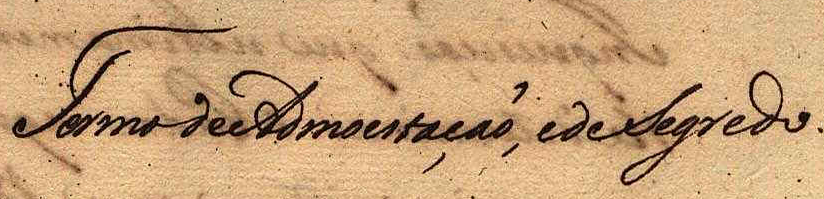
Forma de Admoestaçaõ, e de Segredo.
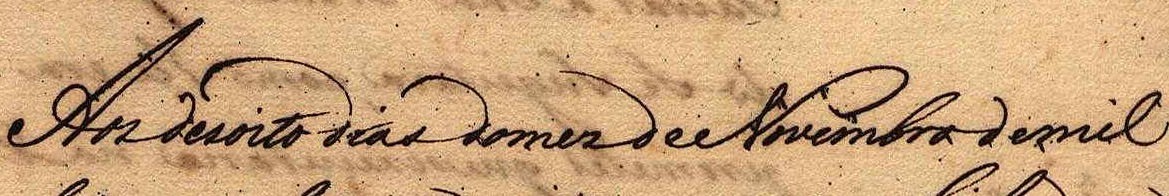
Aos desoito dias do mez de Novembro de mil
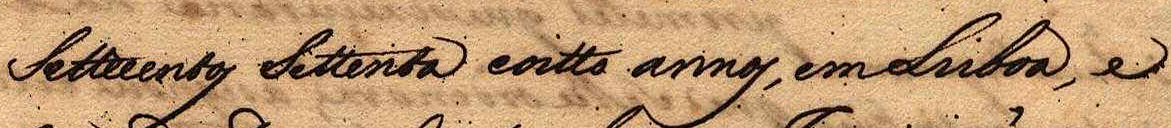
Settecentos Settenta e oitto annos, em Lisboa, e
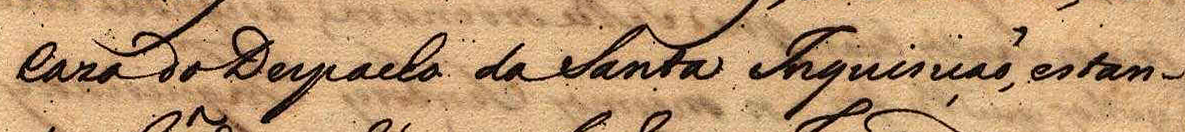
caza do Despacho da Santa Inquisiçaõ, estan
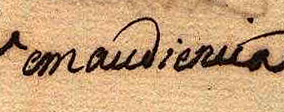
em audiencia
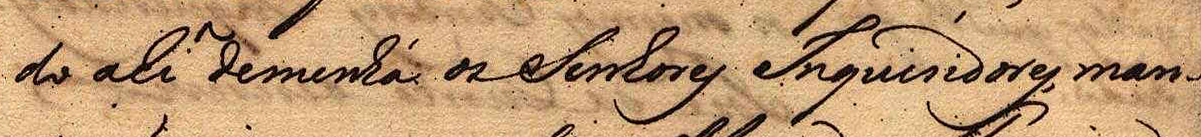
do ahi de menhã os Senhores Inquisidores, man
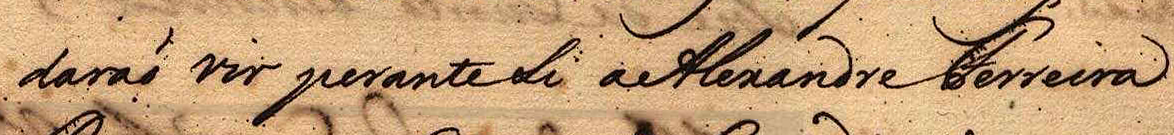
daraõ vir perante Si a Alexandre Ferreira
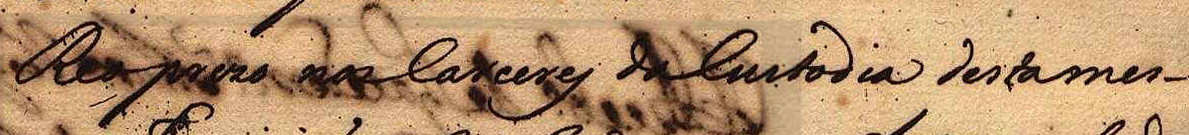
Reo, prezo nos Carceres da Custodia desta mes
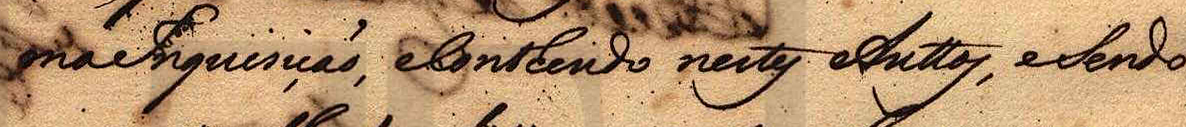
ma Inquisiçaõ, e Contheudo nestes Auttos, e Sendo
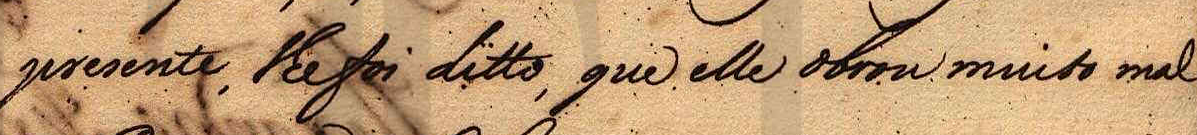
presente, lhe foi ditto, que elle obrou muito mal
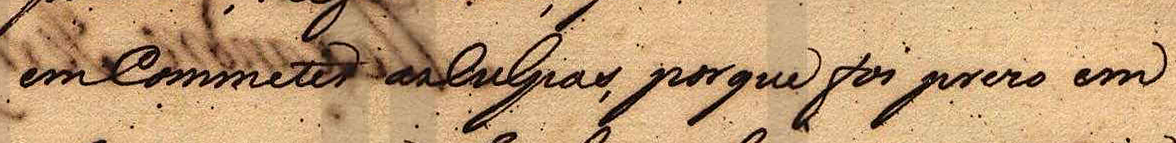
em Commeter as Culpas, porque foi prezo em
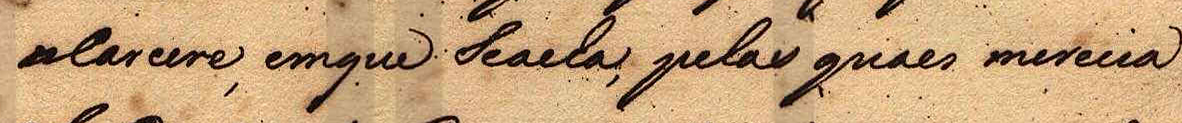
o carcere em que Se acha, pelas quaes merecia
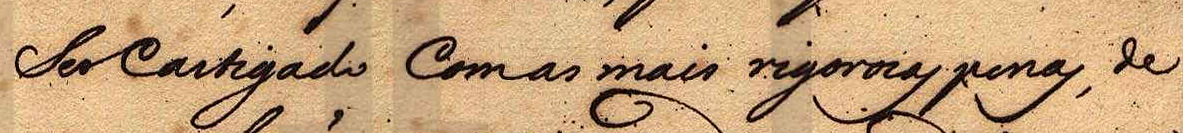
Ser Castigado Com as mais rigorozas penas, de
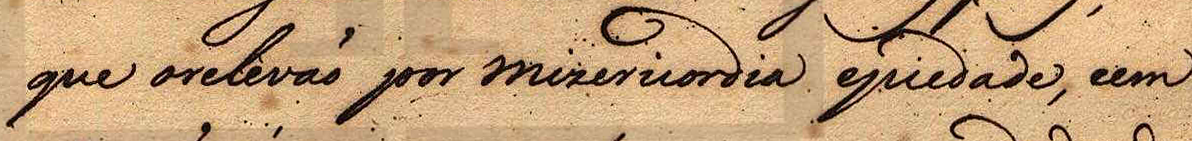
que o relevaõ por mizericordia e piedade, e em
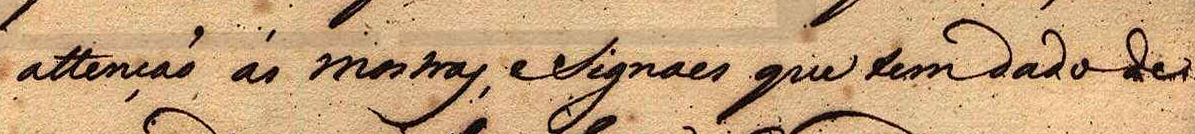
attençaõ ás mostras, e Signaes que tem dado de
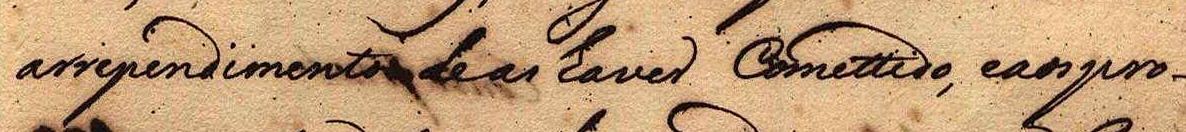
arrependimento de as haver Comettido, e aos pro
